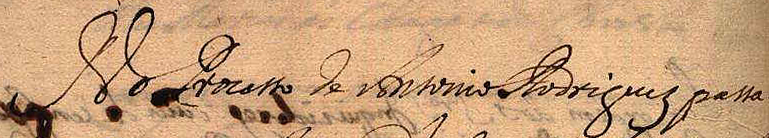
No Processo de Antonio Rodriguez passa
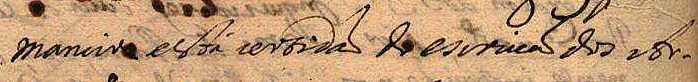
maneira está certidaõ do escriuaõ dos Ar
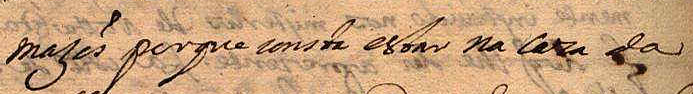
mazēs porque consta estar na caza da
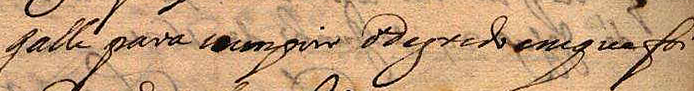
galle para cumprir o degredo em que foi
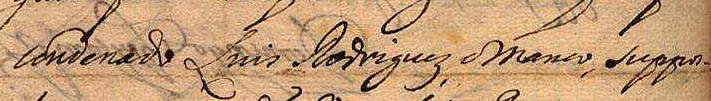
condenado Luis Rodriguez, o manco, suppos
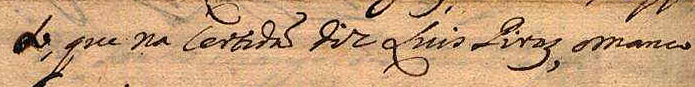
to, que na certidaõ diz Luis Pirez, o manco
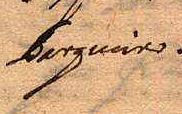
barqueiro.
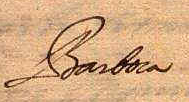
Barboza
